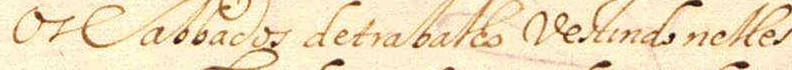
Os Sabbados de trabalho vestindo nelles
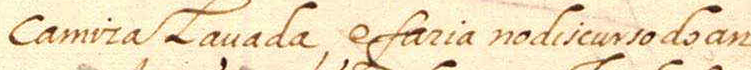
camiza Lauada, e fazia no discurso do an
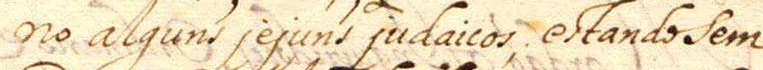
no alguñs jejuñs judaicos, estando sem
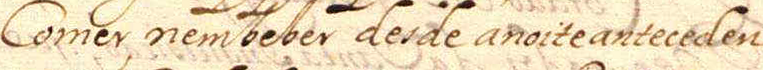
Comer, nem beber desde a noite anteceden
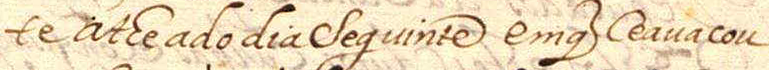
te athe a do dia Seguinte em q̄ Ceaua cou
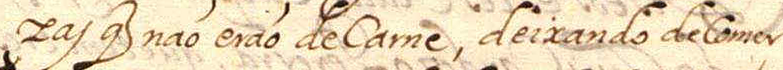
zas q̄ naõ eraõ de Carne, deixando de Comer
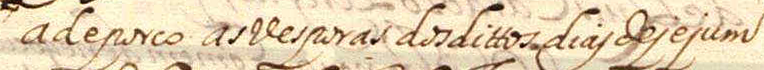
a de porco as vesporas dos dittos dias de jejum
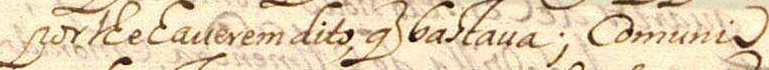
por lhe hauerem dito, q̄ bastaua; Comuni
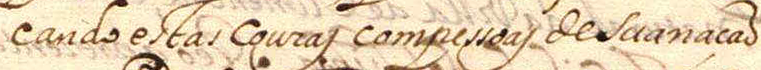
cando estas couzas com pessoas de sua naçaõ
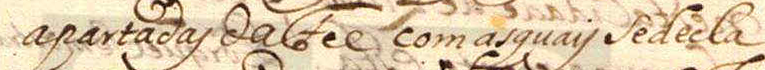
apartadas da Fee com as quais se decla
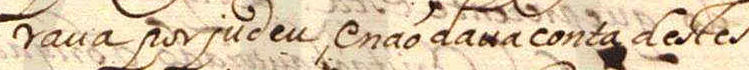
raua por judeu, e naõ daua conta destes
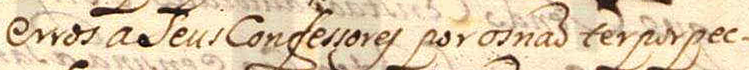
erros a Seus Confessores por os naõ ter por pec
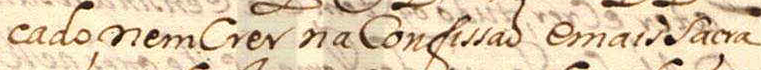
cado, nem Crer na Confissaõ e mais sacra
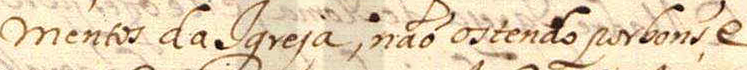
mentos da Igreja, naõ os tendo por boñs, e
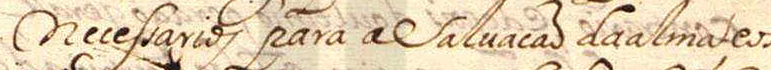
Necessarios para a Saluacaõ da alma, e os
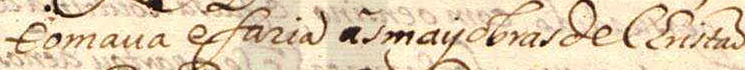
tomaua e fazia as mais obras de Christaõ
